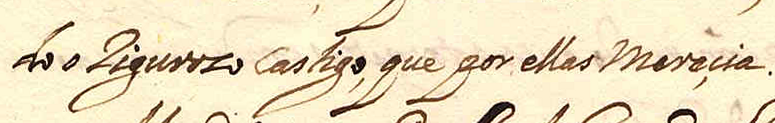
do o Rigurozo castigo, que por ellas merecia.
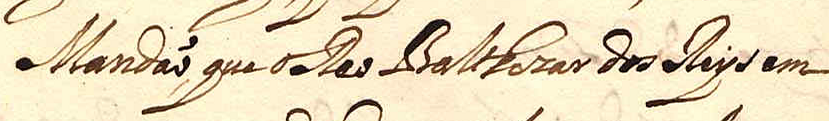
Mandaõ, que o Reo Balthezar dos Reys em
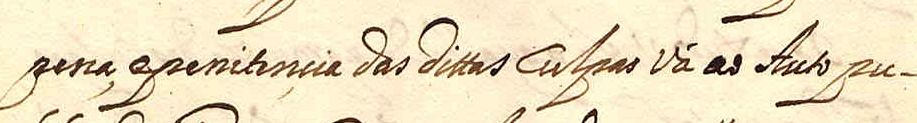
pena, e penitencia das dittas Culpas vá ao Auto pu
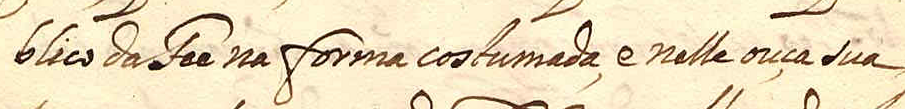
blico da Fee na forma costumada, e nelle ouça sua
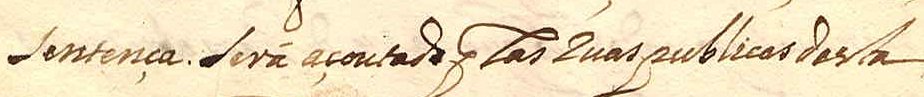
sentença. será açoutado p̄las ruas publicas desta
